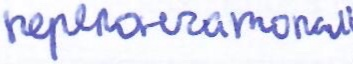перепончатопал
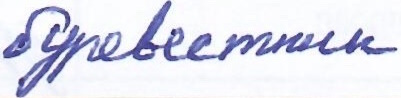буревестник
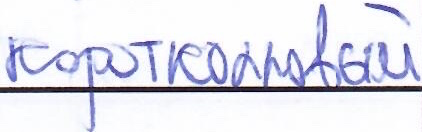короткоалювый
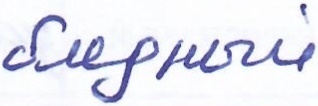бледный
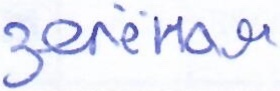зелёная
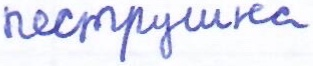пеструшка
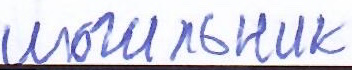могильник
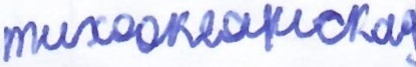тихоокеанская
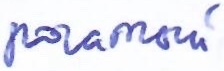рогатый
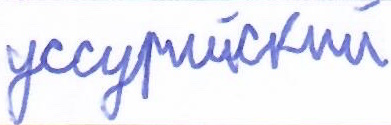уссурийский
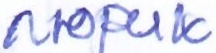люрик
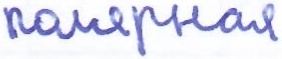полярная
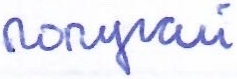попугай
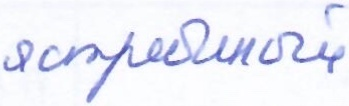ястребиный
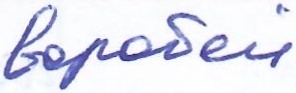воробей
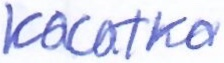касатка
